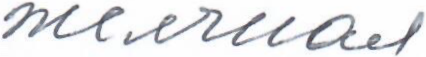желчная
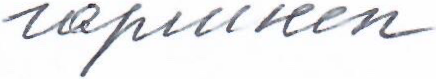гаршнеп
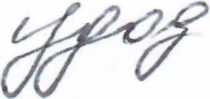удод
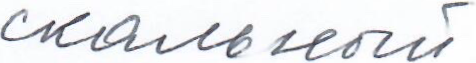скальный
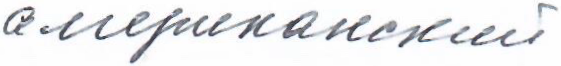американский
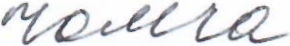чомга
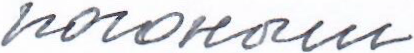погоныш
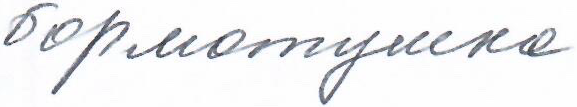бормотушка
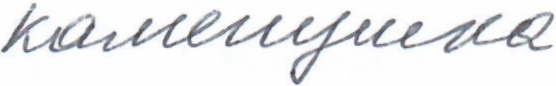каменушка
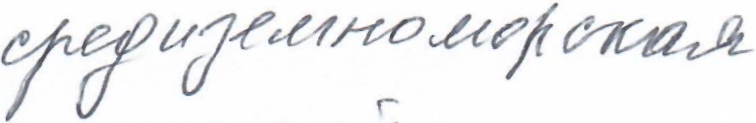средиземноморская
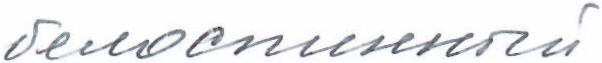белоспинный
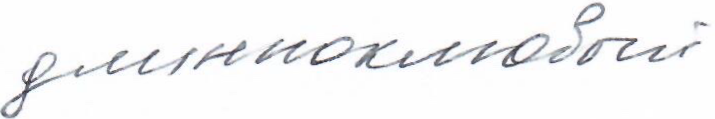длинноклювый
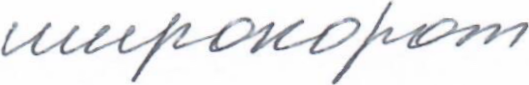широкорот
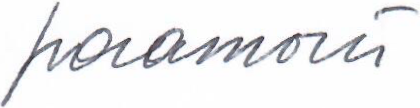рогатый
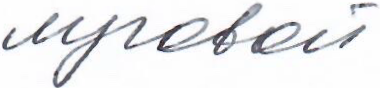луговой
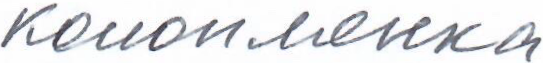коноплянка
